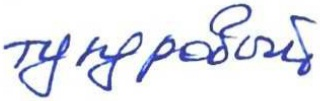тундровый
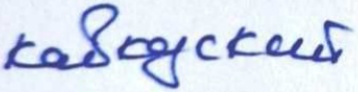кавкозский
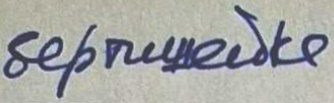вертишейка
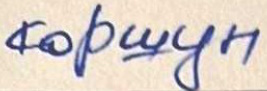коршун
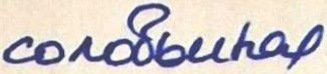соловьиная
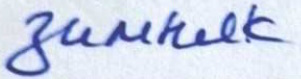зимняк
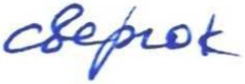сверчок
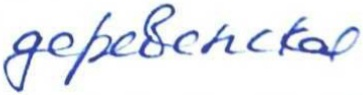деревенская
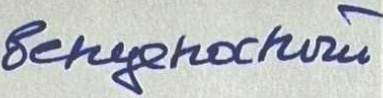венценосный
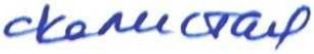скалистая
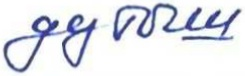дутыш
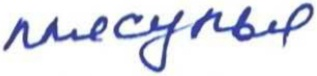плясунья
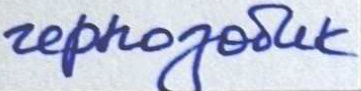чернозобик
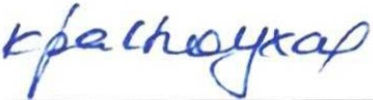красноухая
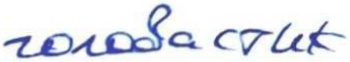головастик
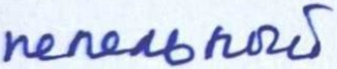пепельный
